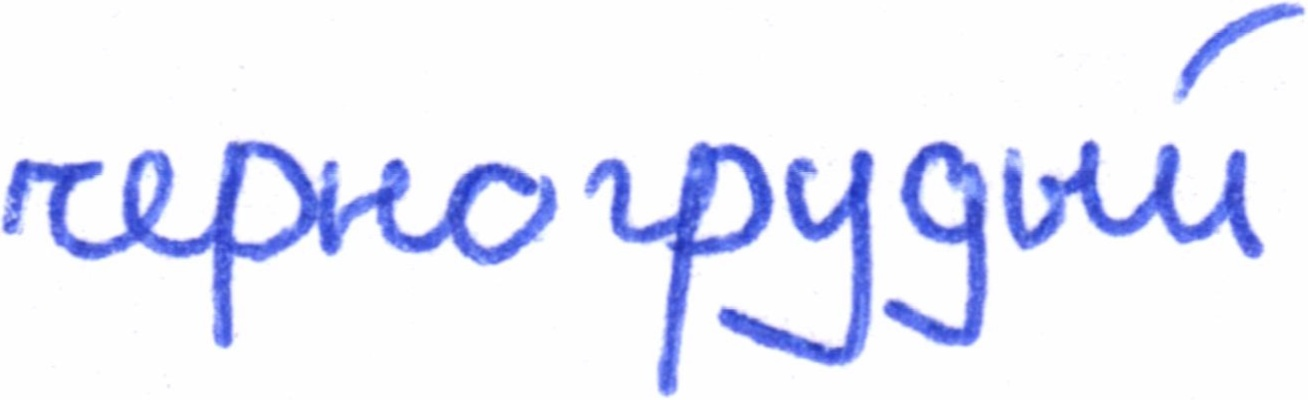черногрудый
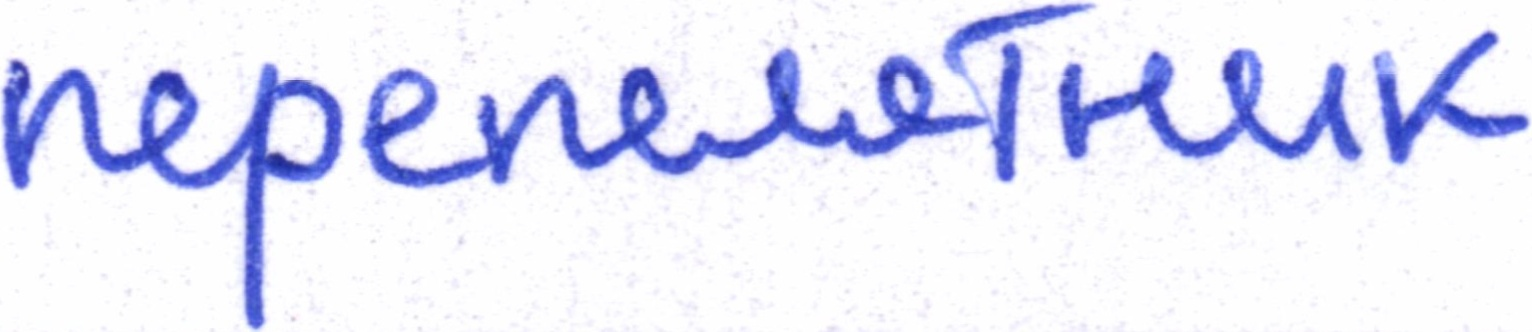перепелятник
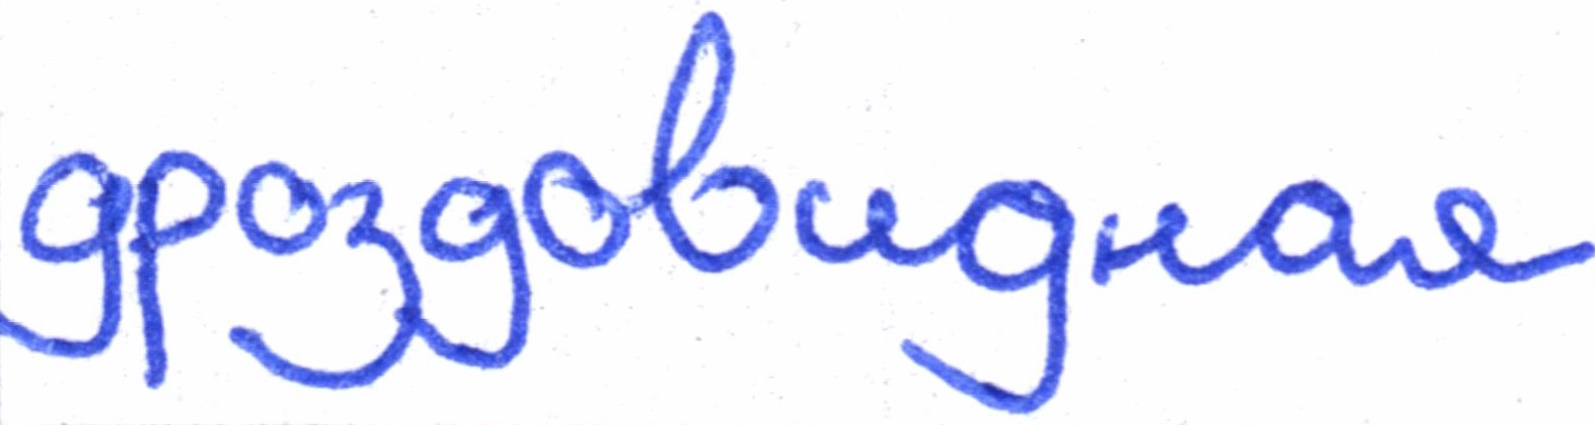дроздовидная
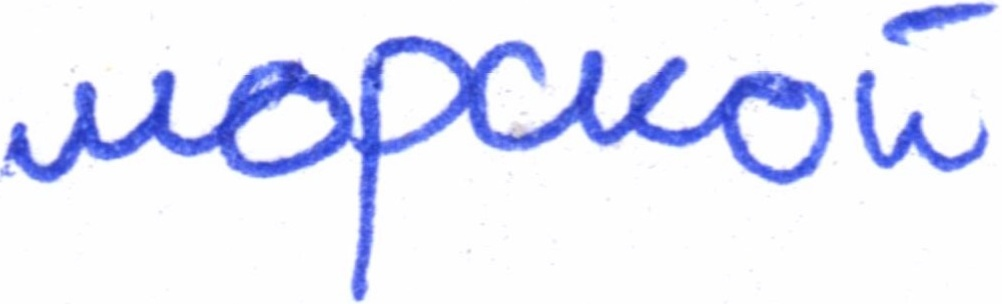морской
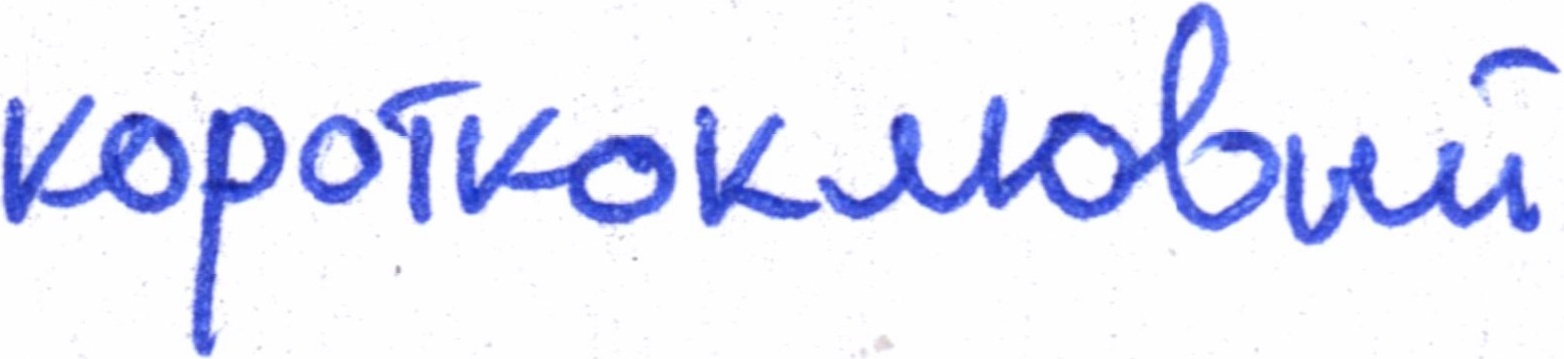короткоклювый
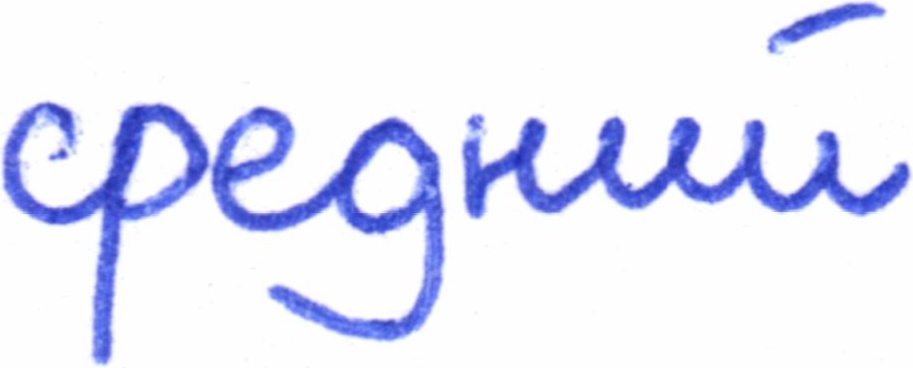средний
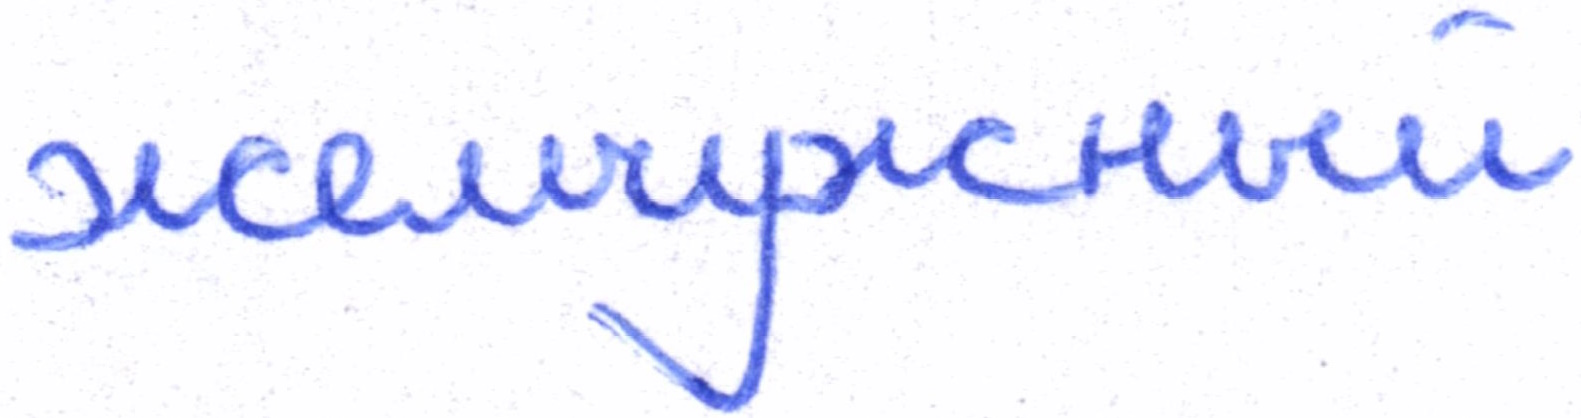жемчужный
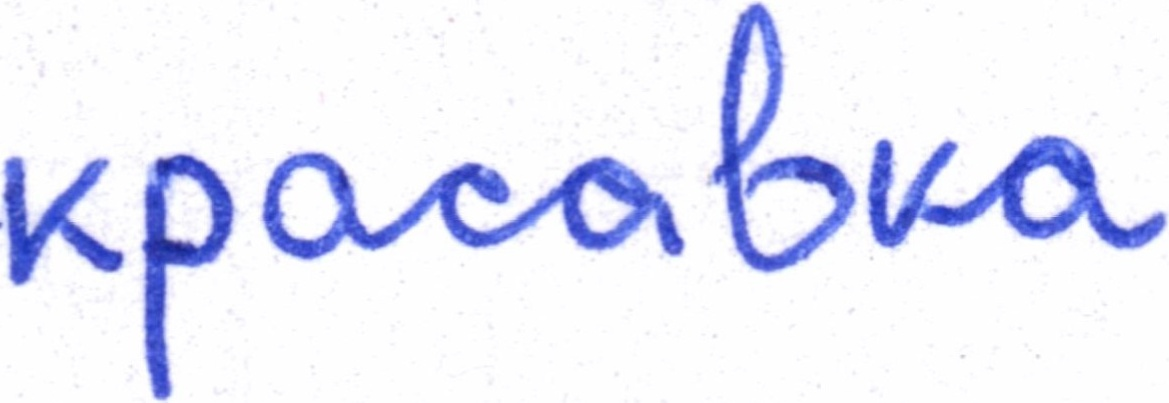красавка
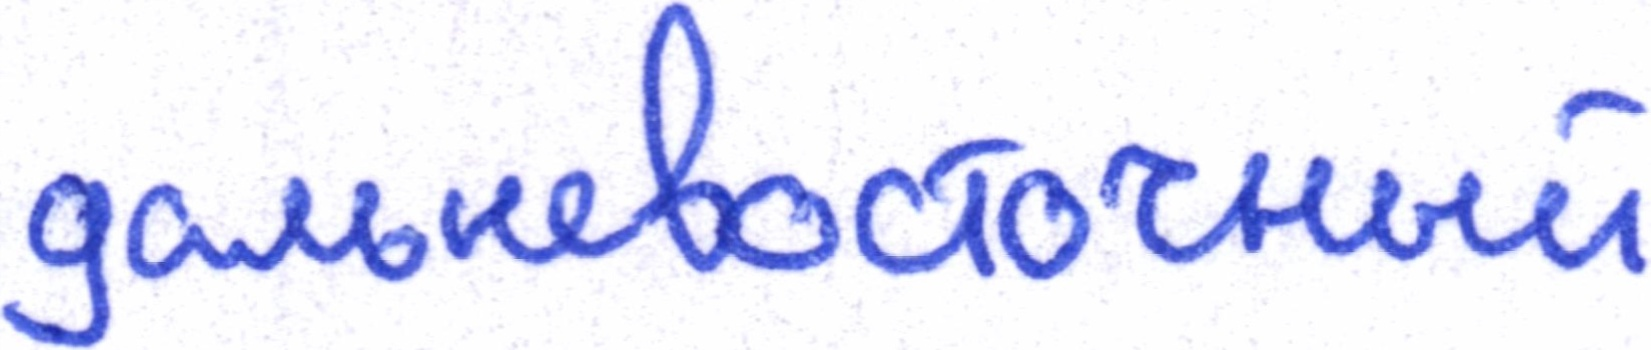дальневосточный
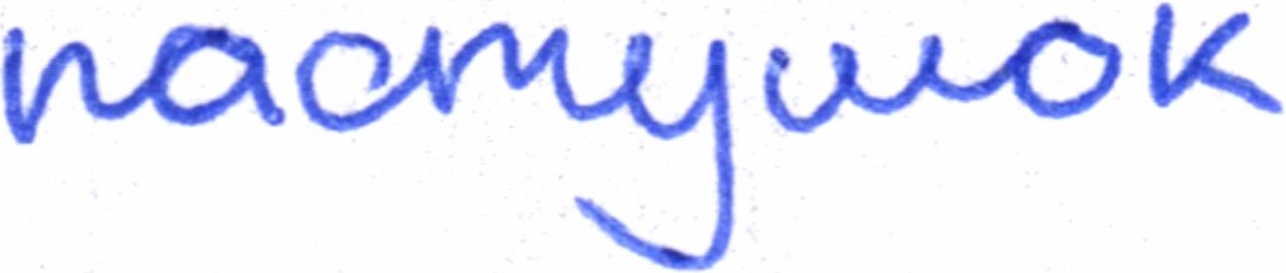пастушок
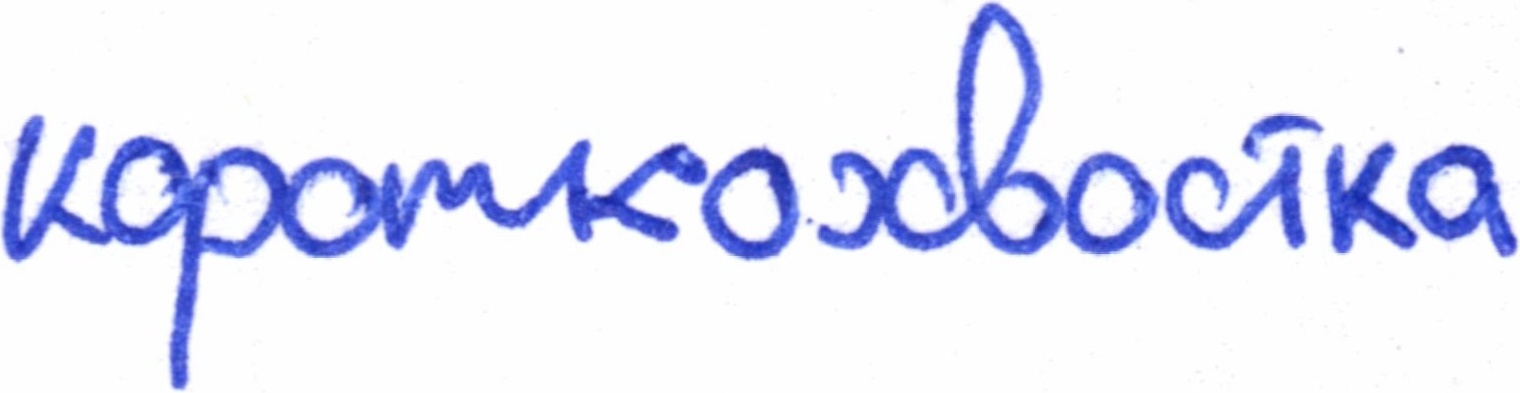короткохвостка
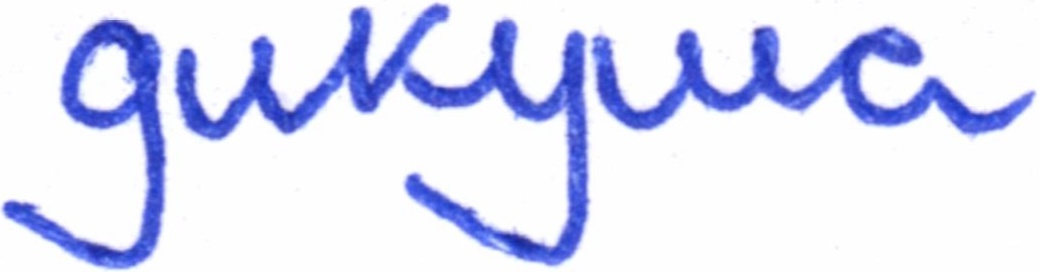дикуша
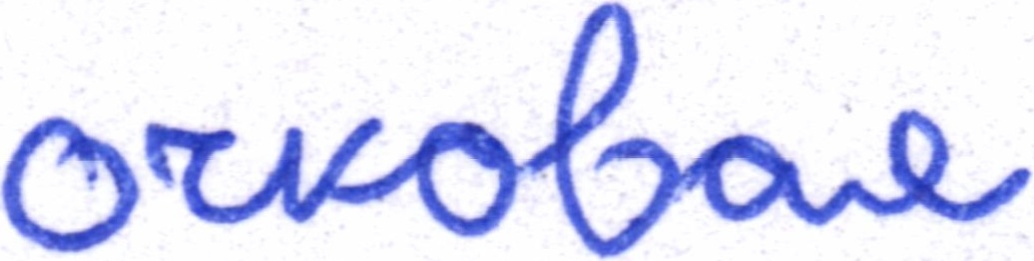очковая
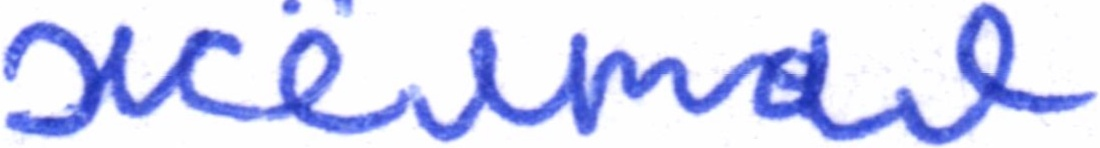жёлтая
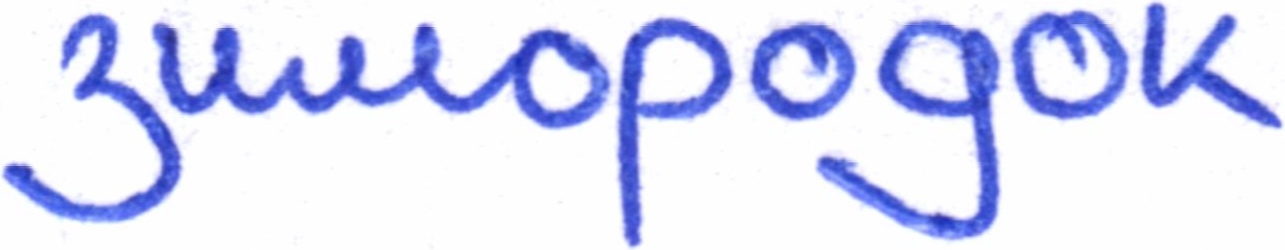зимородок
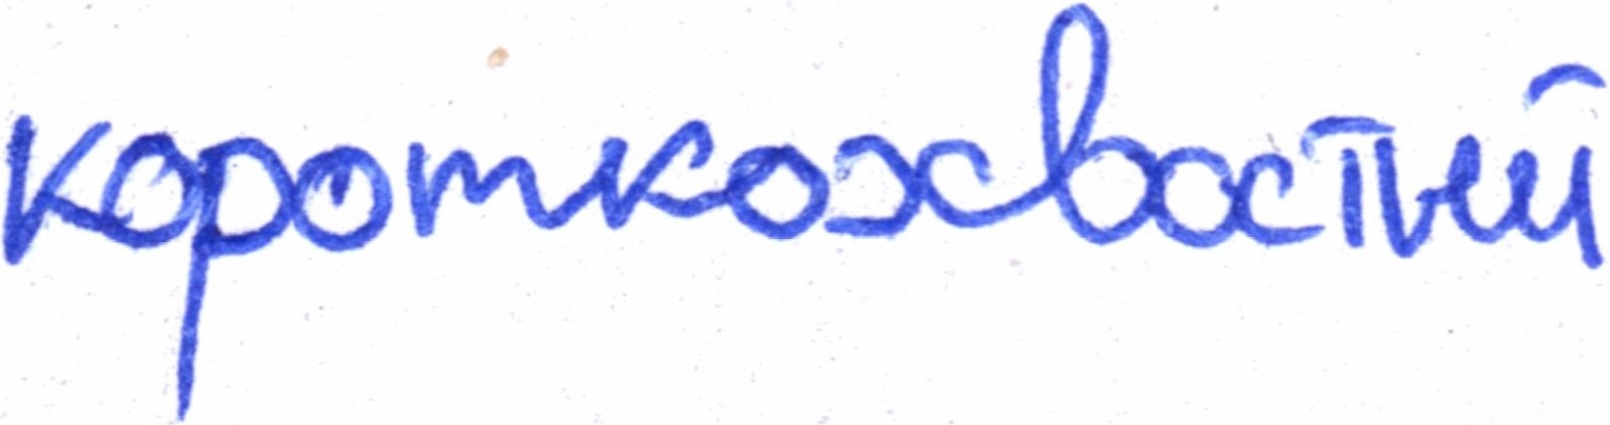короткохвостый
